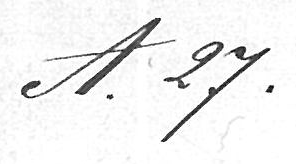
A. 27.
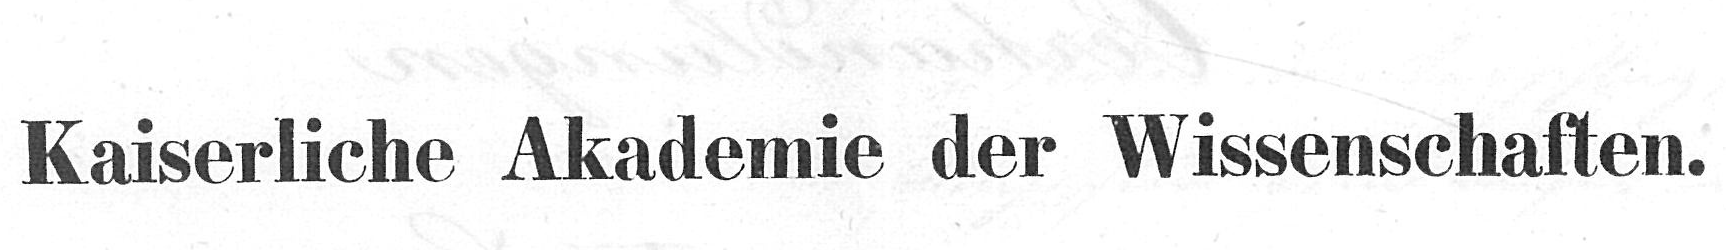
Kaiserliche Akademie der Wissenschaften.
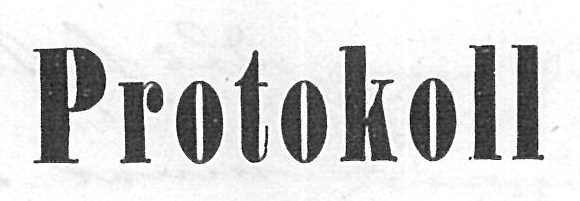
Protokoll
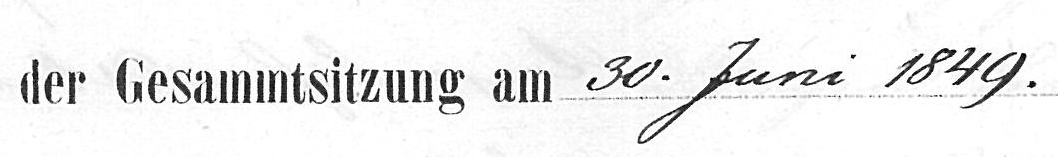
der Gesammtsitzung am 30. Juni 1849.
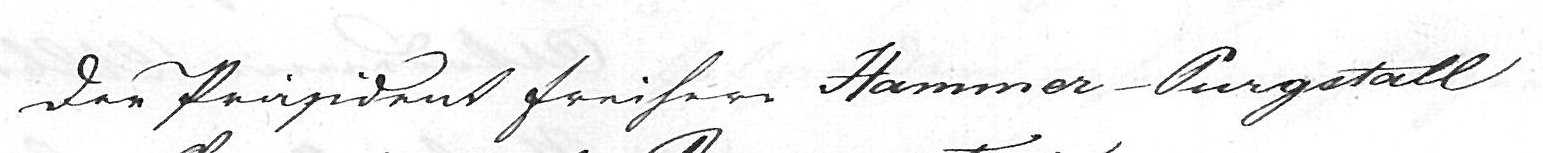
der Präsident Freiherr Hammer-Purgstall
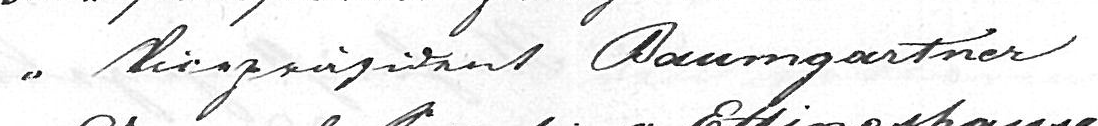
" Vicepräsident Baumgartner
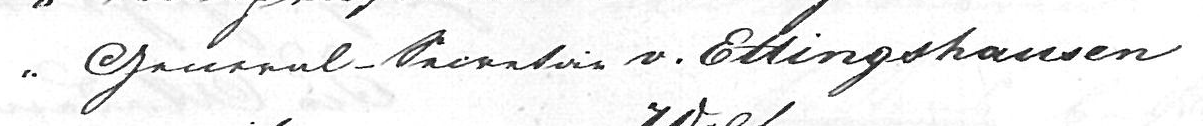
" General-Secretär v. Ettingshausen
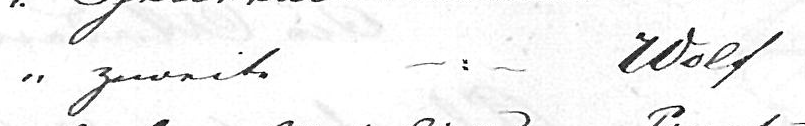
" zweite -:- Wolf
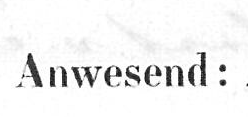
Anwesend:
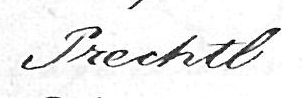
Prechtl
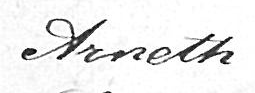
Arneth
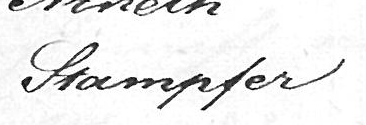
Stampfer
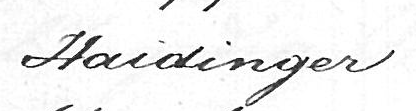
Haidinger
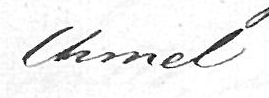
Chmel
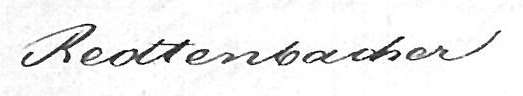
Redtenbacher
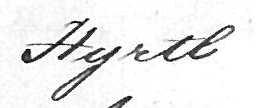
Hyrtl
